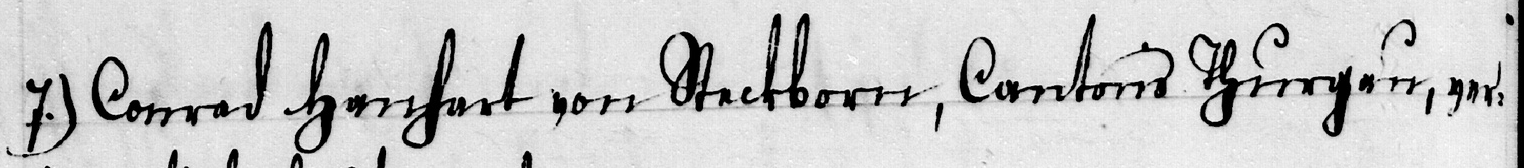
7.) Conrad Hanhart von Steckborn, Cantons Thurgau, ve¬
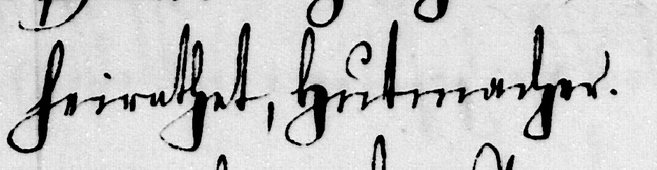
rheirathet, Hutmacher.
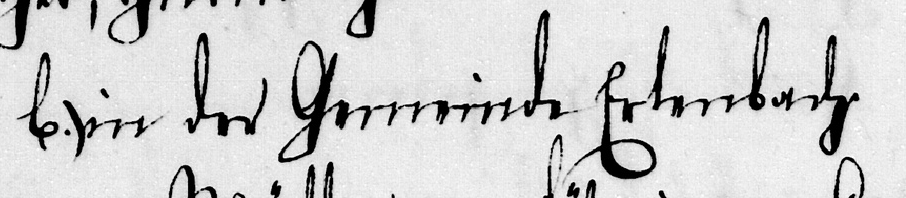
in der Gemeinde Erlenbach.
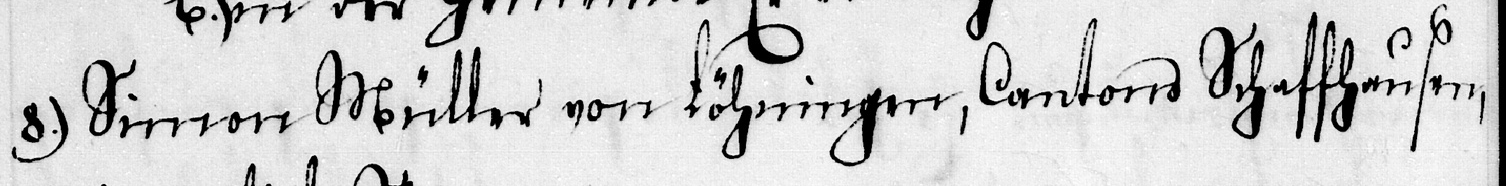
8.) Simon Müller von Löhningen, Cantons Schaffhausen,
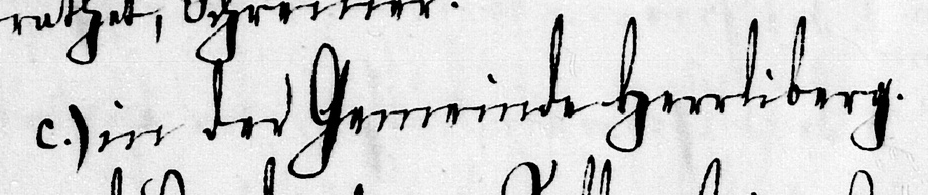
c.) in der Gemeinde Herrliberg.
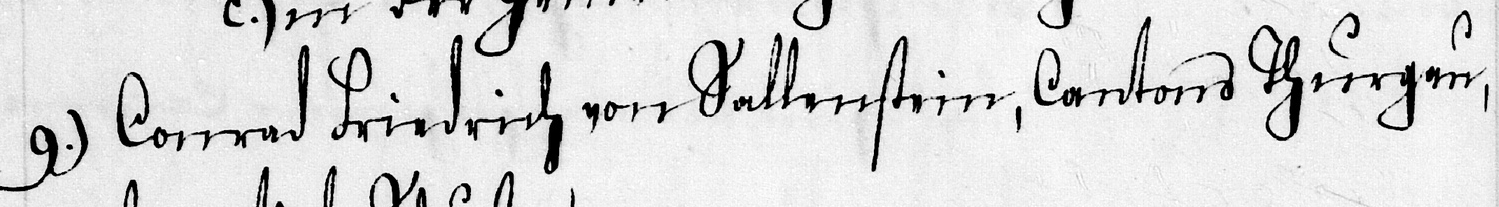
9.) Conrad Friedrich von Sallenstein, Cantons Thurgau,
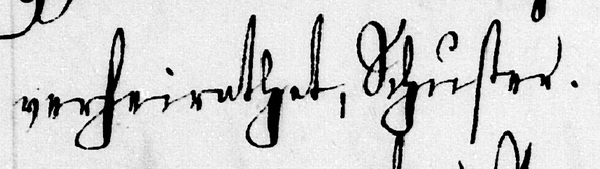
verheirathet, Schuster.
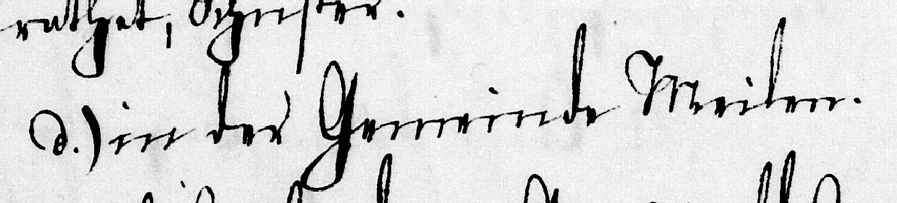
d.) in der Gemeinde Meilen.
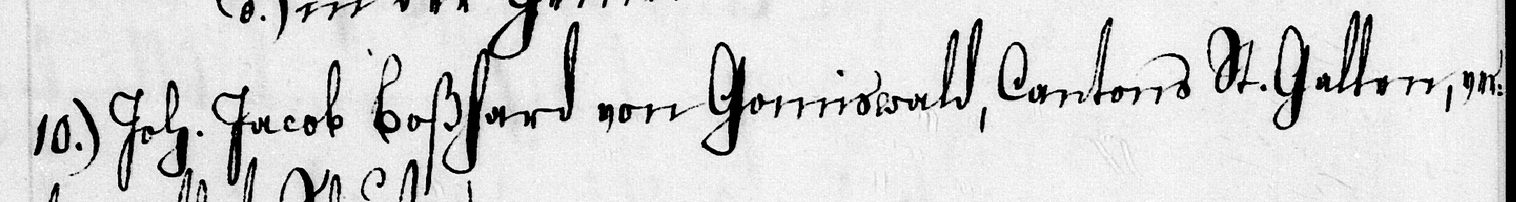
10.) Joh. Jacob Boßhard von Gomiswald, Cantons St. Gallen,
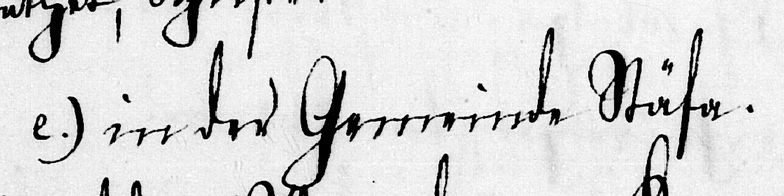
e.) in der Gemeinde Stäfa.
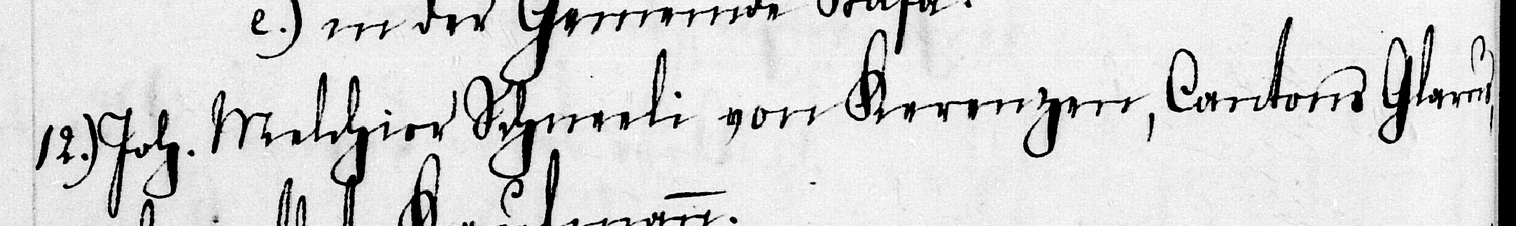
12.) Joh. Melchior Schneeli von Kerenzen, Cantons Glarus,
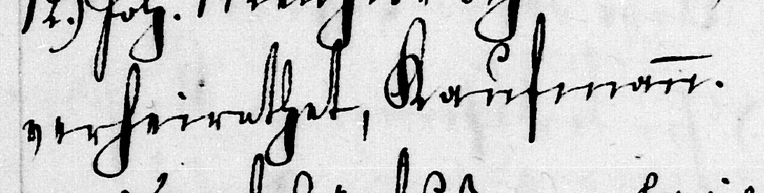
verheirathet, Kaufmann.
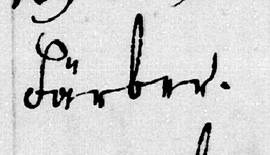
Färber.
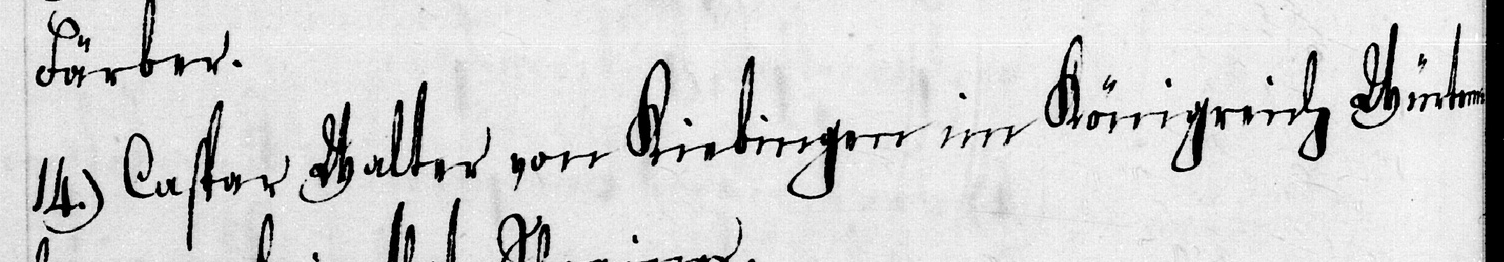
14.) Caspar Walter von Kiebingen im Königreich Würte¬
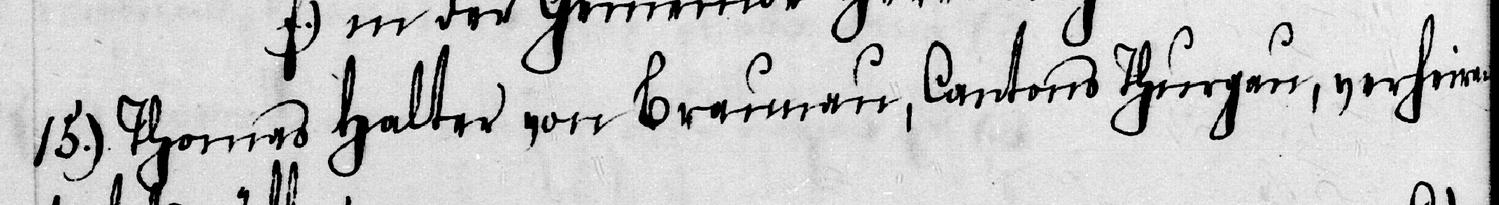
15.) Thomas Halter von Braunau, Cantons Thurgau, verheir¬
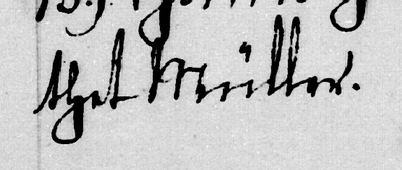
athet Müller.
